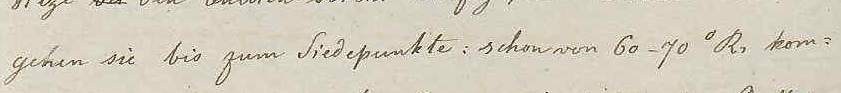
gehen sie bis zum Siedpunkte: schon von 60–70° R. kom-
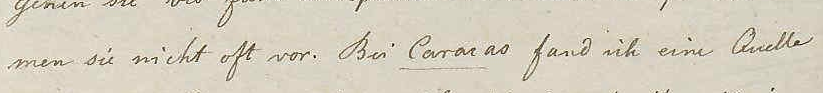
men sie nicht oft vor. Bei Caracas fand ich eine Quelle
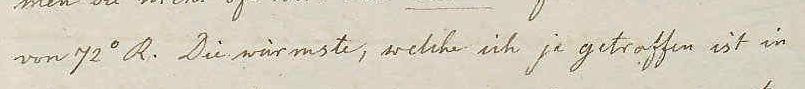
von 72° R. Die wärmste, welche ich je getroffen ist in
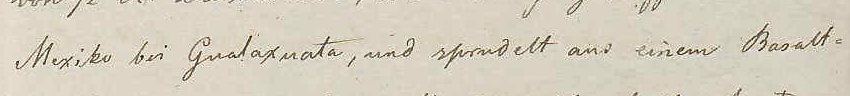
Mexiko bei Gualaxuata, und sprudelt aus einem Basalt-
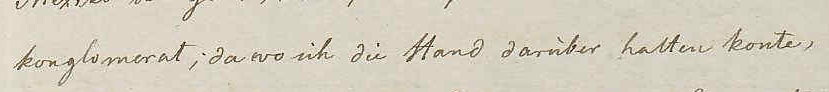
konglomerat; da wo ich die Hand darüber halten konte,
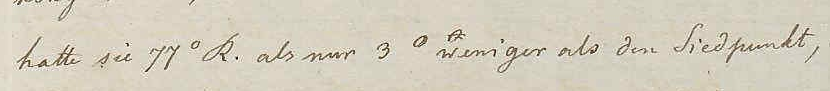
hatte sie 77° R. nur 3° weniger als den Siedpunkt,
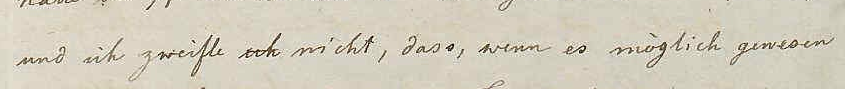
und ich zweifle ichnicht, dass, wenn es möglich gewesen
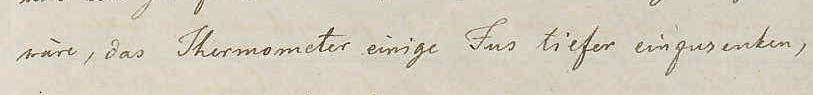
wäre, das Thermometer einige Fus tiefer einzusenken,
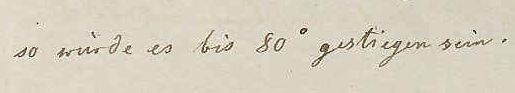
so würde es bis 80° gestiegen sein.
